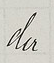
steht.
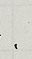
es
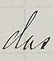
aber
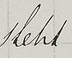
eine
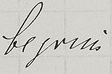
begrün-
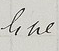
bis zur
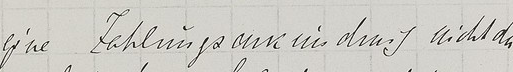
eine Zahlungsankündung nicht da.
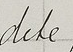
diesen
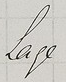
der
